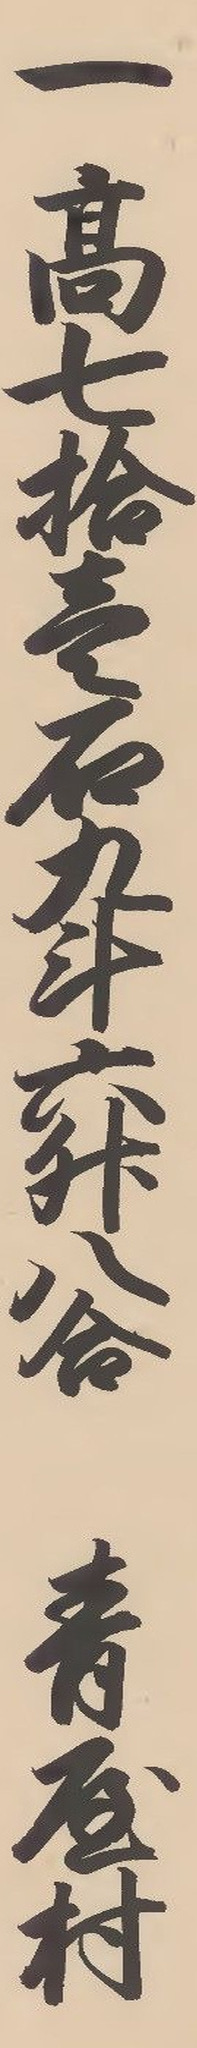一高七拾壱石九斗六升八合青屋村
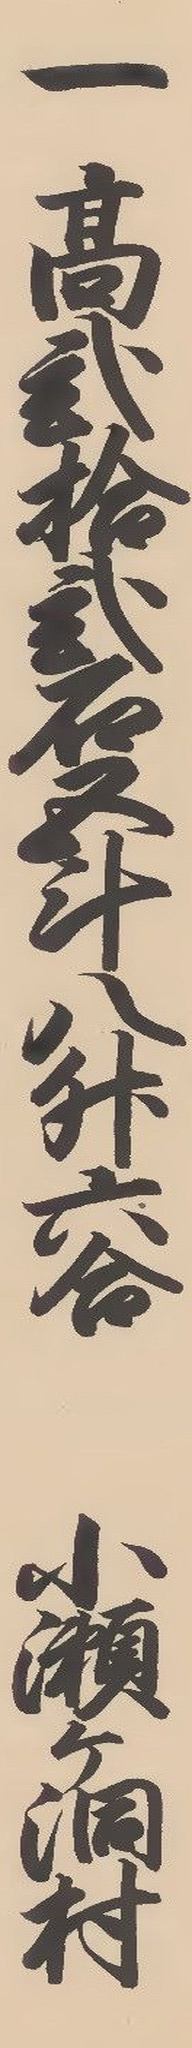一高弐拾弐石五斗八升六合小瀬ヶ洞村
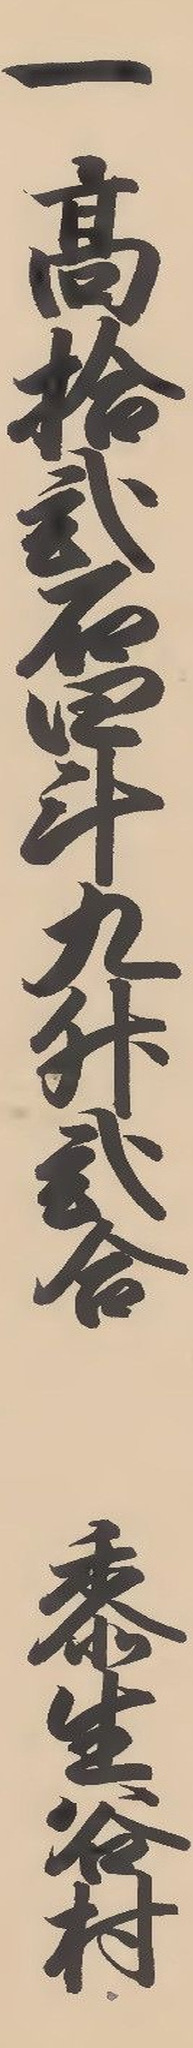一高拾弐石四斗九升弐合黍生谷村
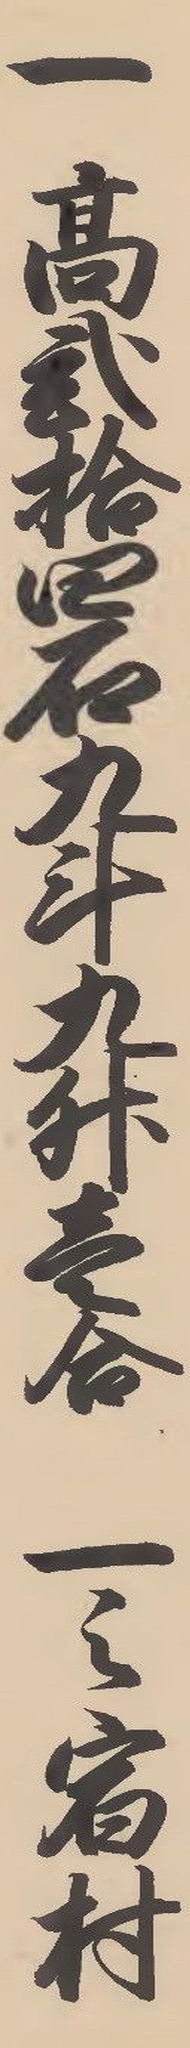一高弐拾四石九斗九升壱合一之宿村
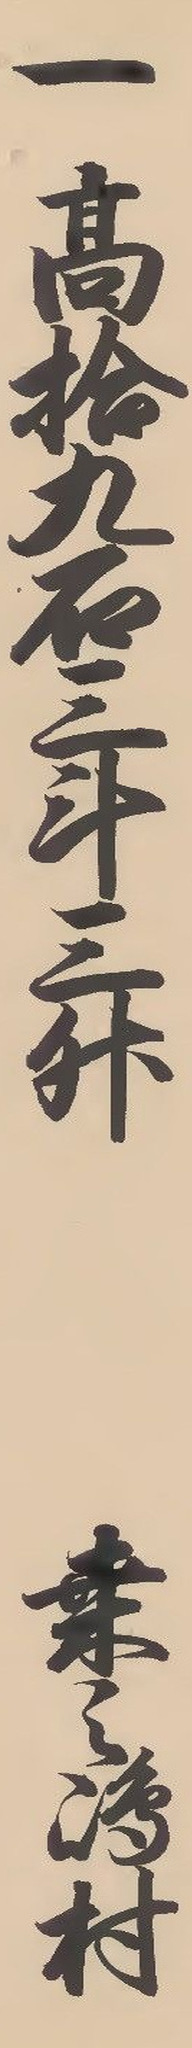一高拾九石三斗三升桑之島村
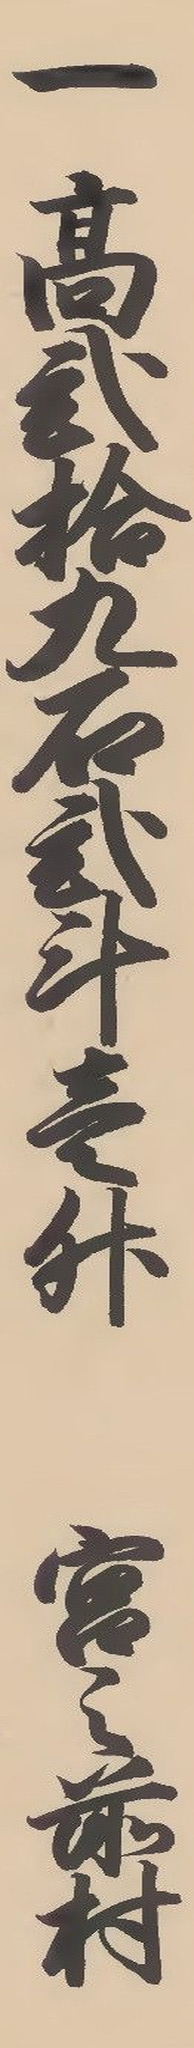一高弐拾九石弐斗壱升宮之前村

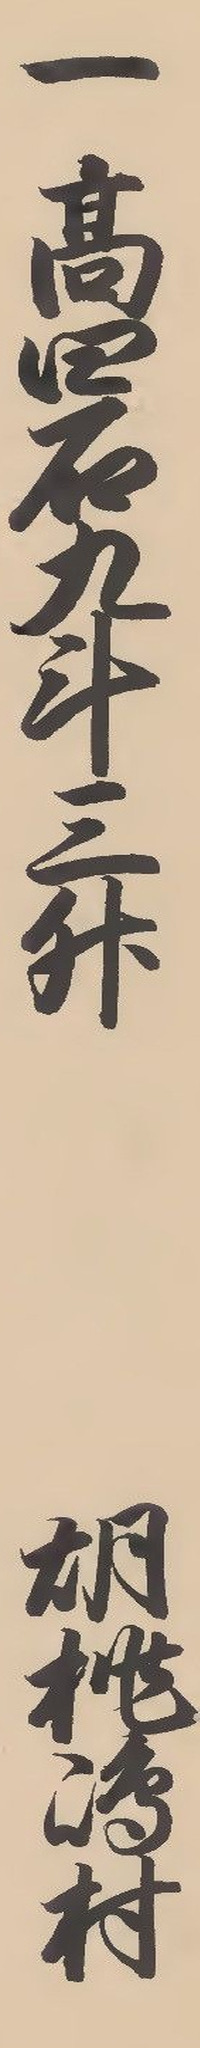一高四石九斗三升胡桃島村
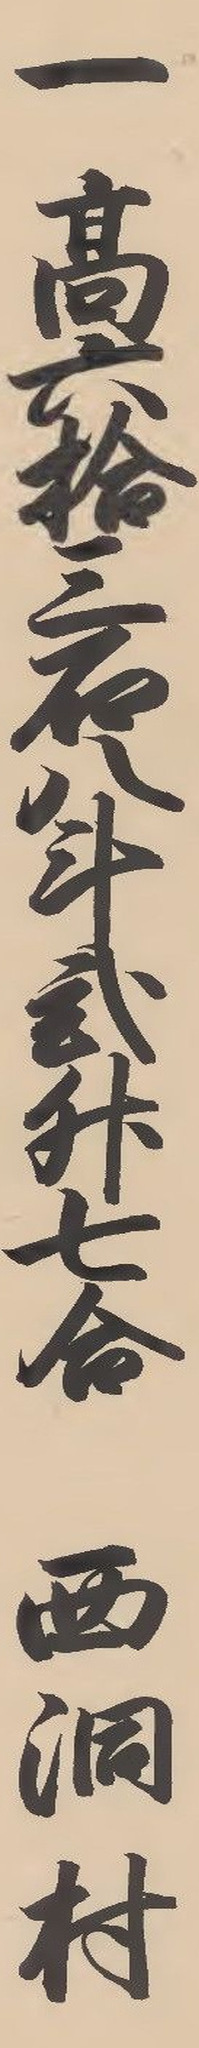一高六拾三石八斗弐升七合西洞村
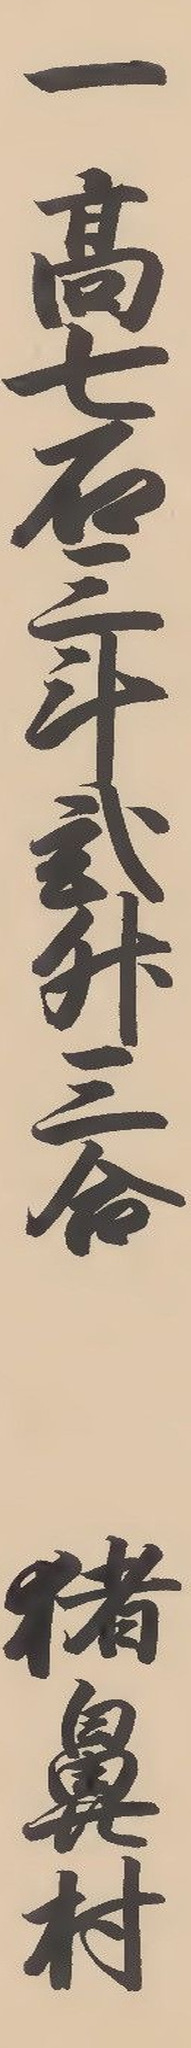一高七石三斗弐升三合猪鼻村
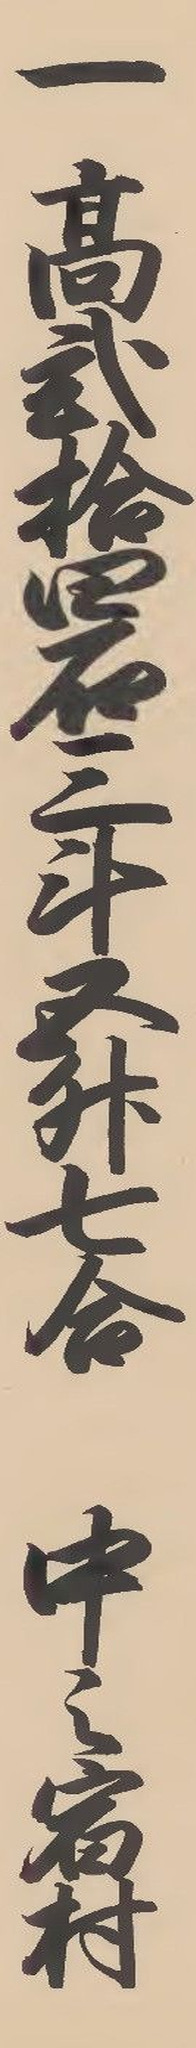一高弐拾四石三斗五升七合中之宿村
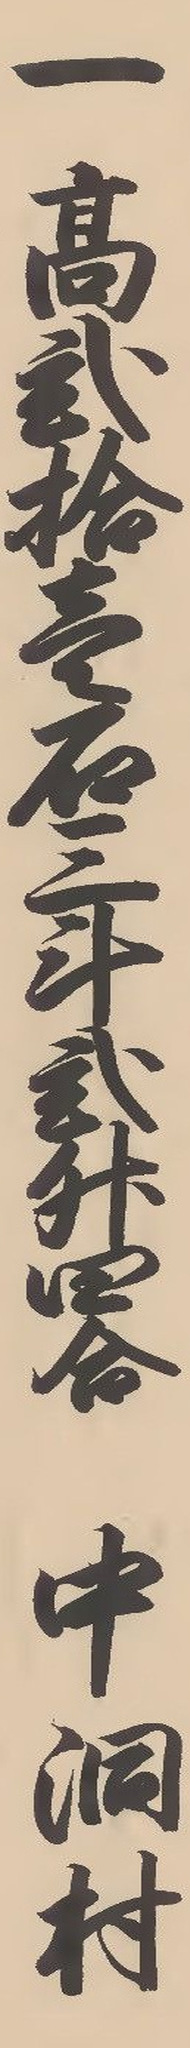一高弐拾壱石三斗弐升四合中洞村
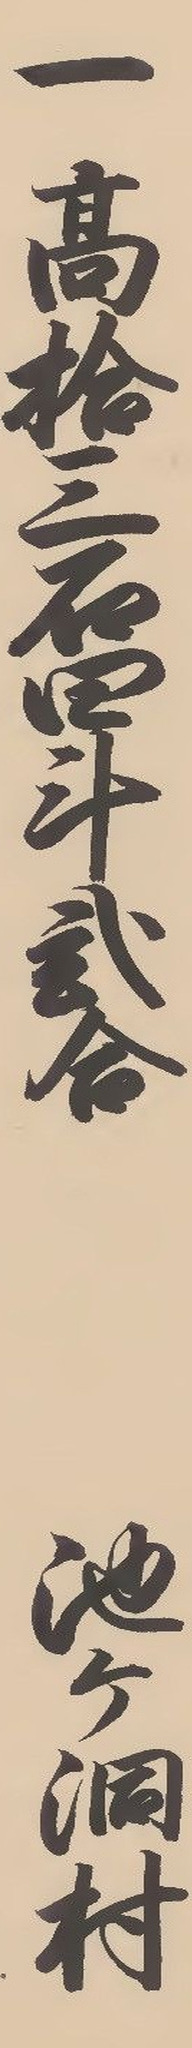一高拾三石四斗弐合池ヶ洞村
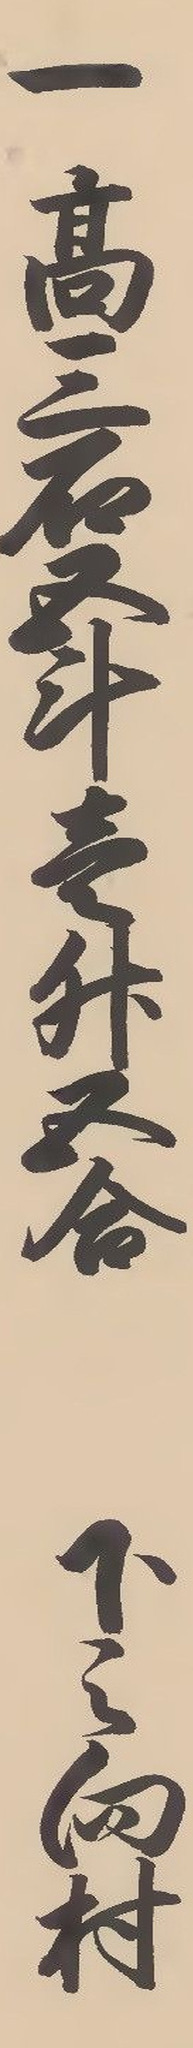一高三石五斗壱升五合下之向村
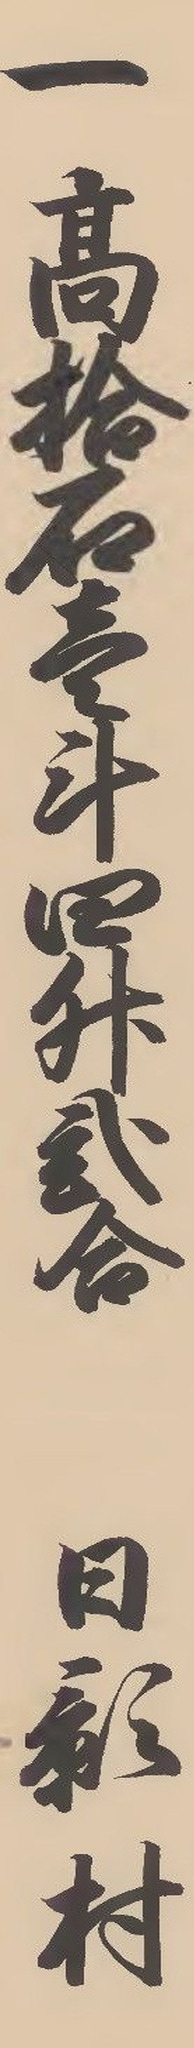一高拾石壱斗四升弐合日影村

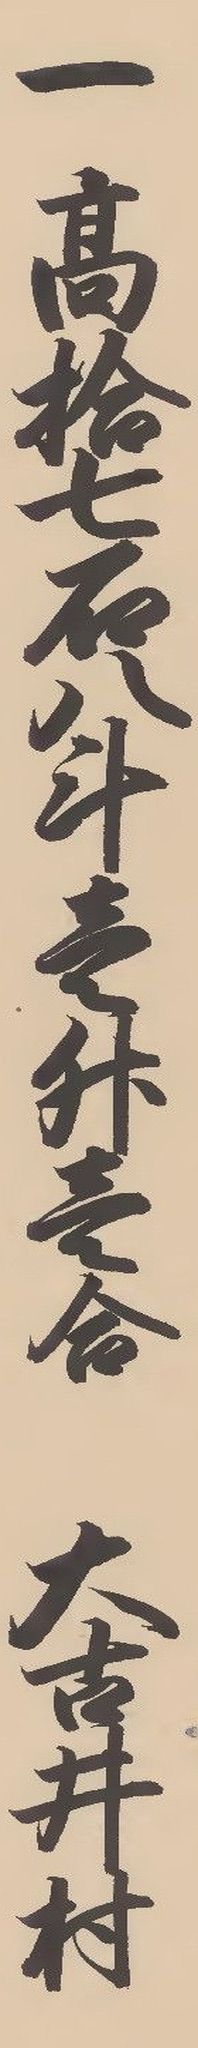一高拾七石八斗壱升壱合大古井村
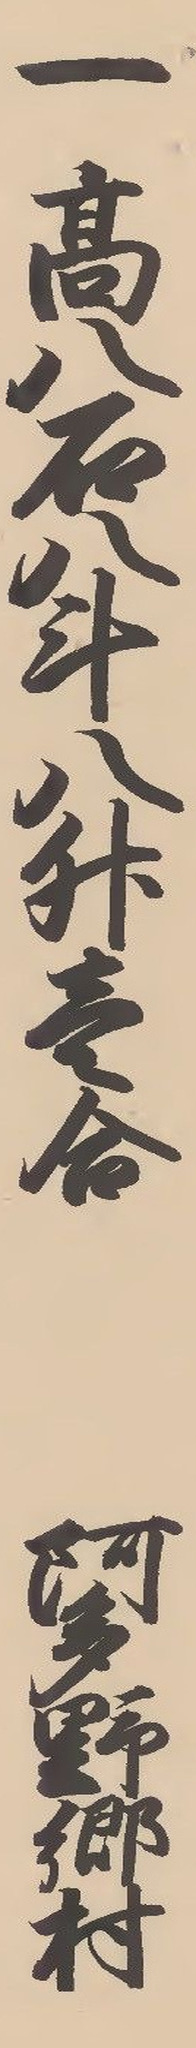一高八石八斗八升壱合阿多野郷村
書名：飛騨国郷帳
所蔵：国立公文書館 National Archives of Japan
